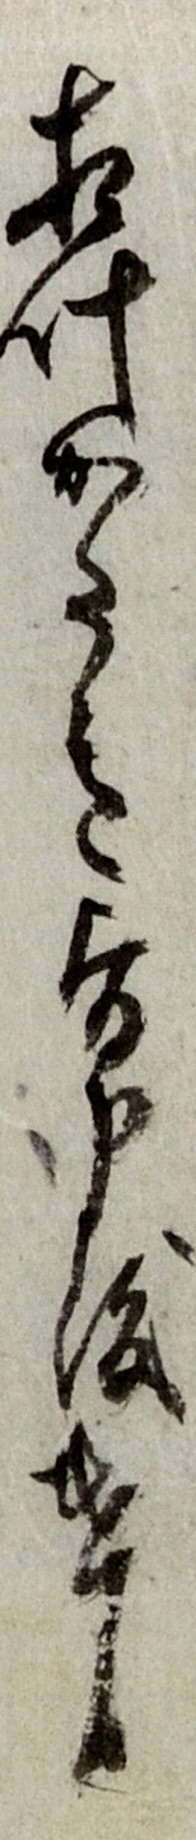相叶かたき旨申渡遣候
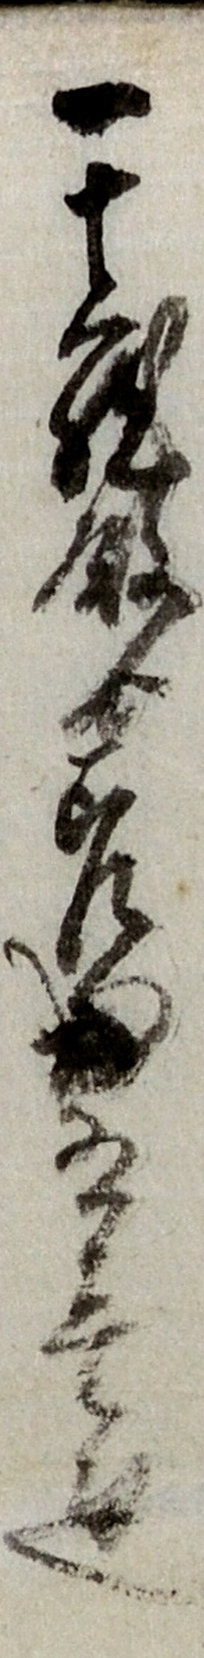一十蔵殿ゟ差出書壱通
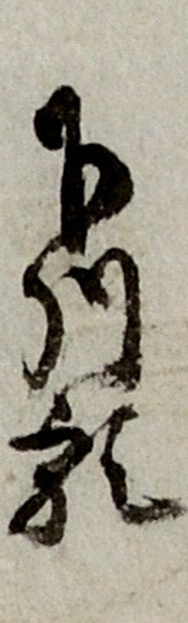下川願
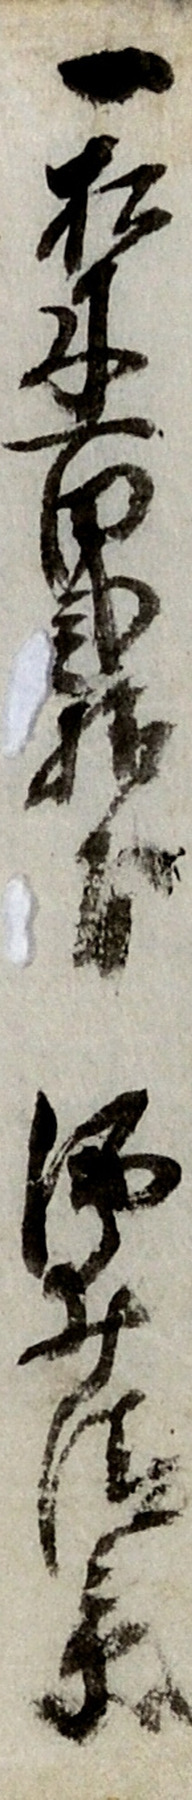一松木百弐拾本酒井清兵衛
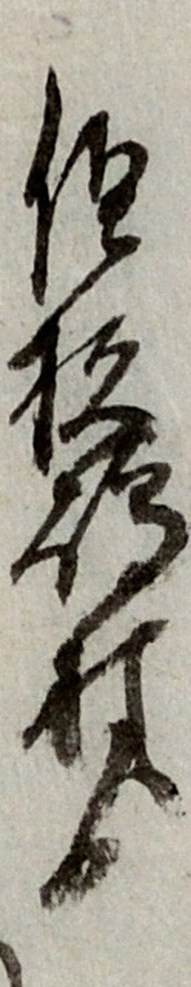但杉島村ゟ
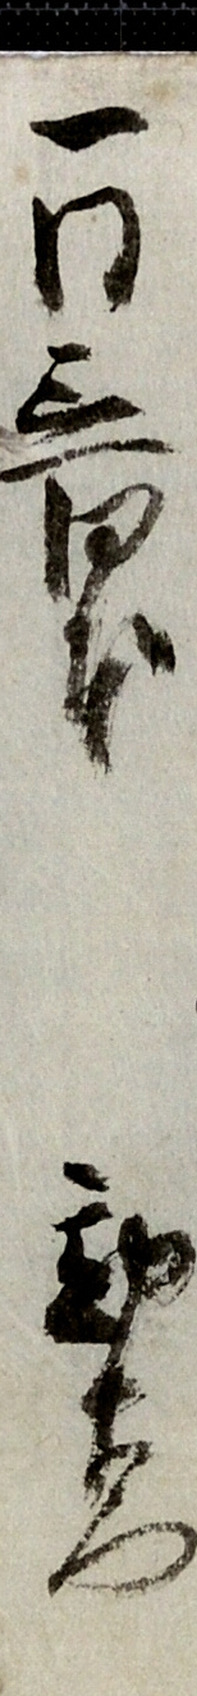一同三百本勘右衛門
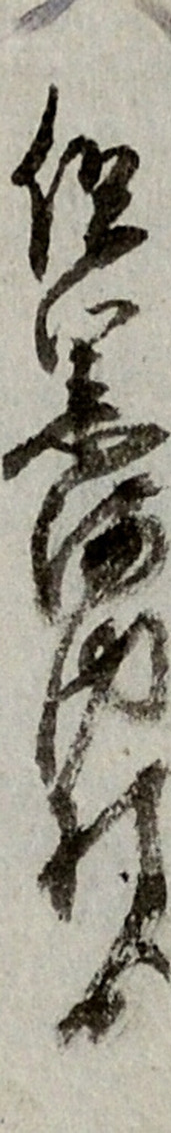但黒河内村ゟ
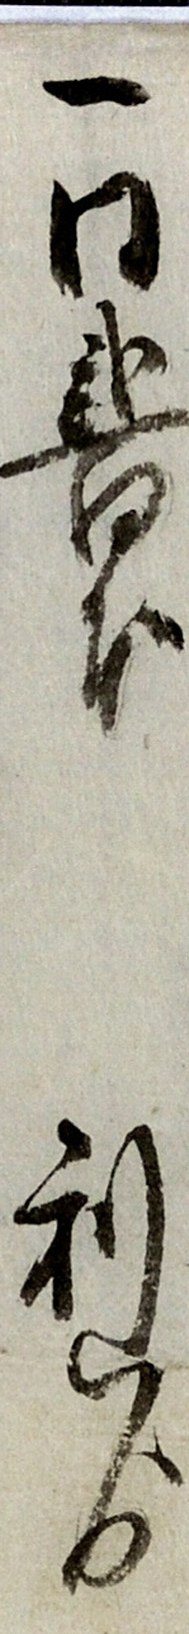一同弐百本利右衛門
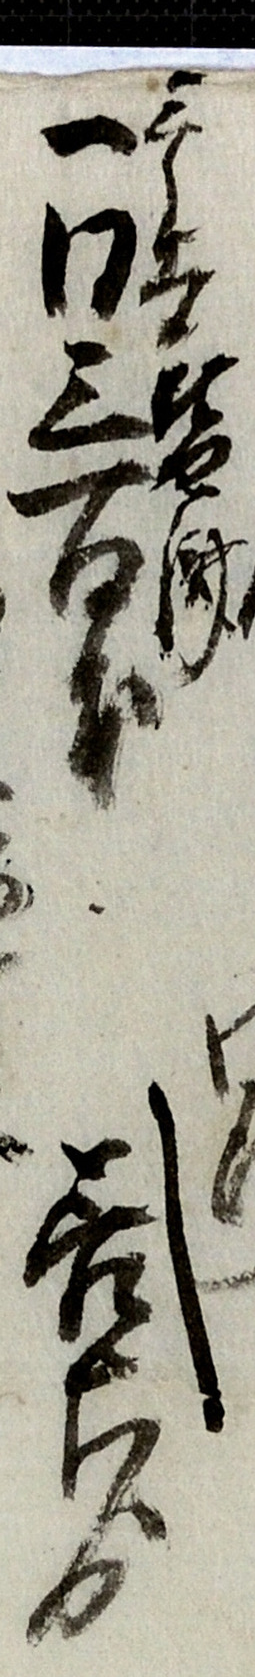一同三百本善右衛門
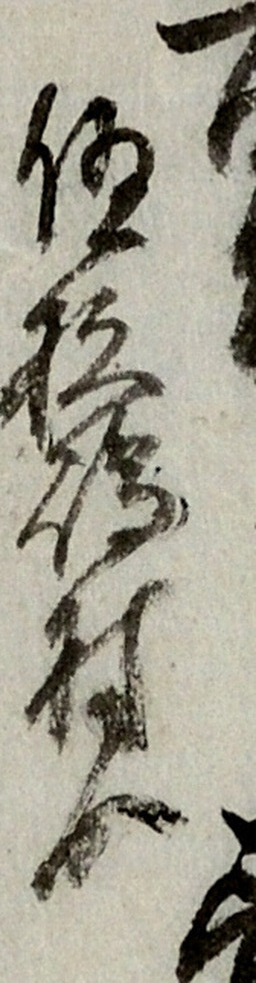但杉島村ゟ
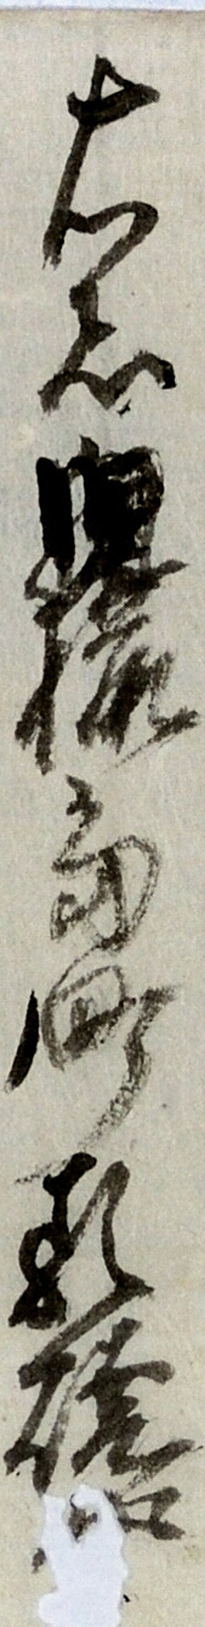右は旧臘当町類焼
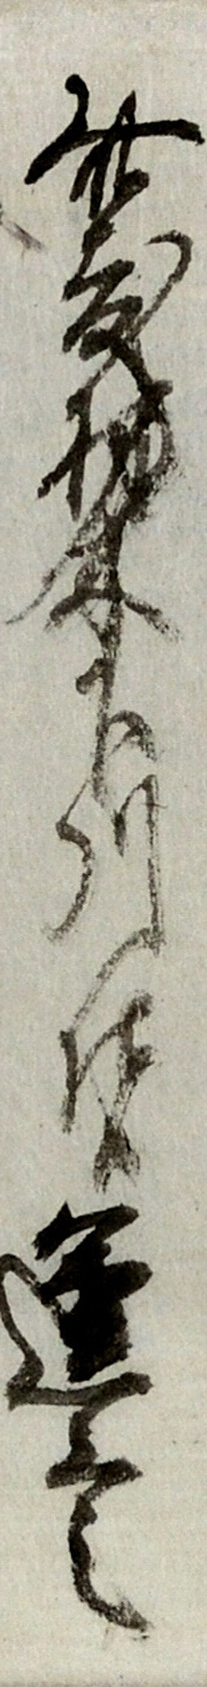此度材木下川仕候運上之
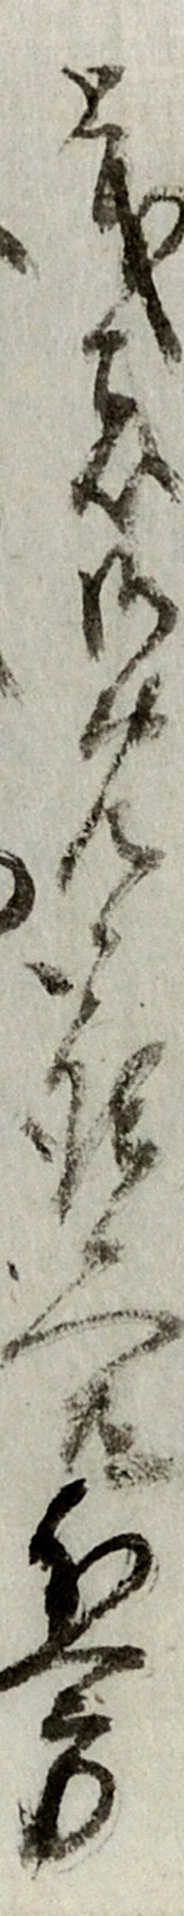義は御免御座候へ共分一方
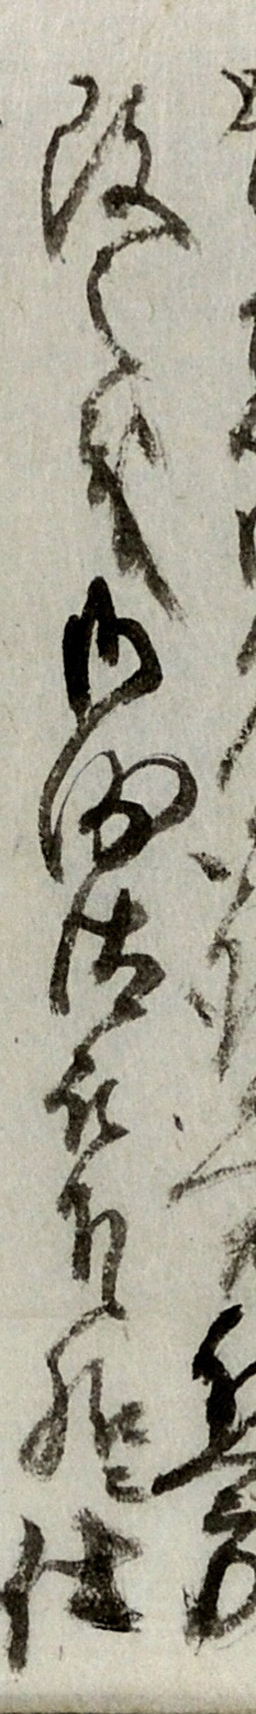改之義御沙汰被下候様ニ仕
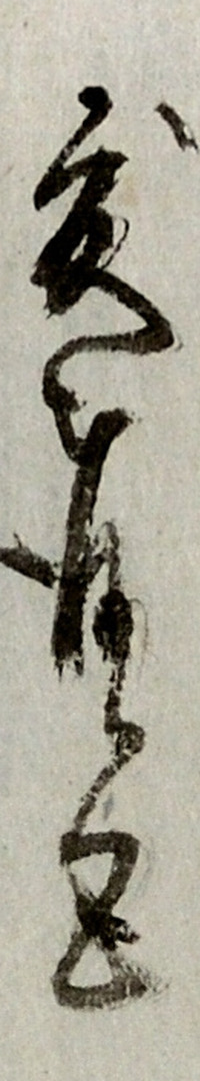度奉存候以上
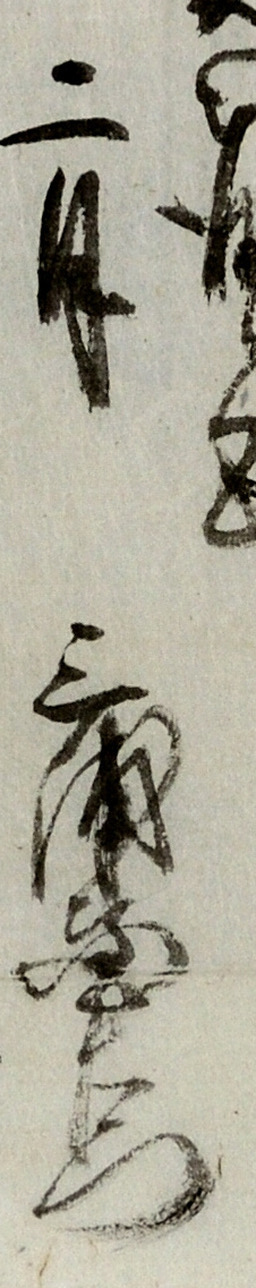二月三浦団右衛門
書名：分一方諸事御用留帳
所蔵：伊那市立高遠町図書館・合同会社AMANE
